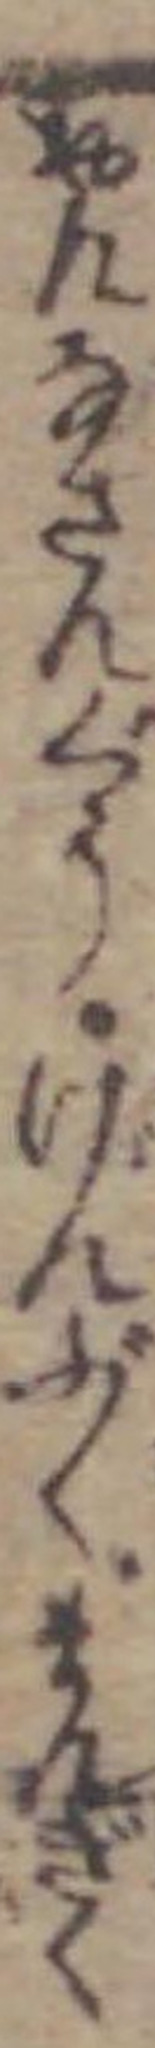おんなさんぐう、げんぶく、まんぎく
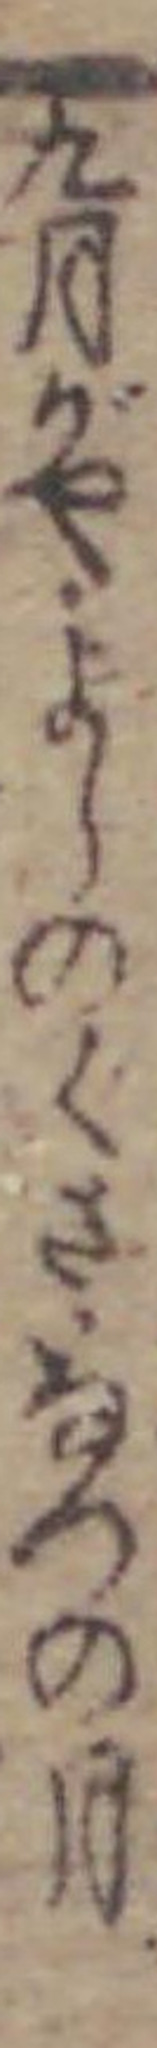九月がや、よしのくさ、なつの月
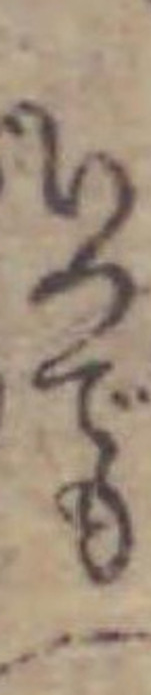いつでも
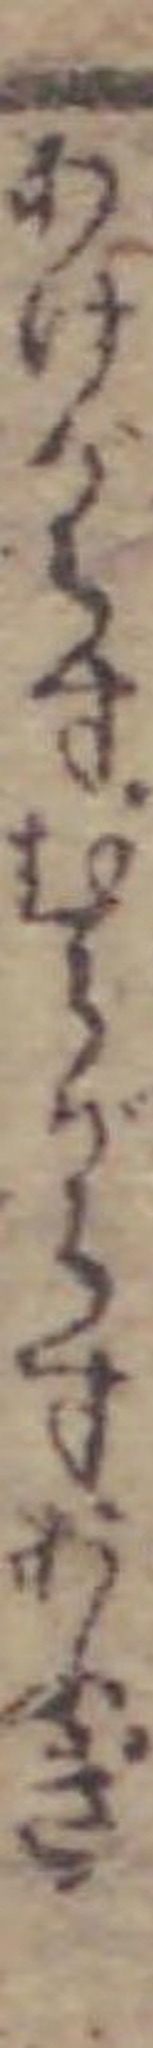あけがらす、むらがらす、あふぎ
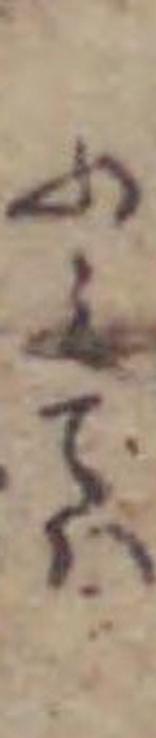ふみては
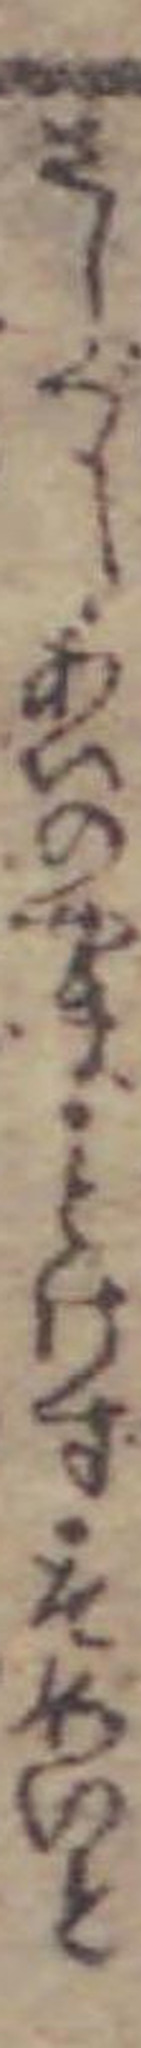さしぐし、あいのやま、とけず、そめいと
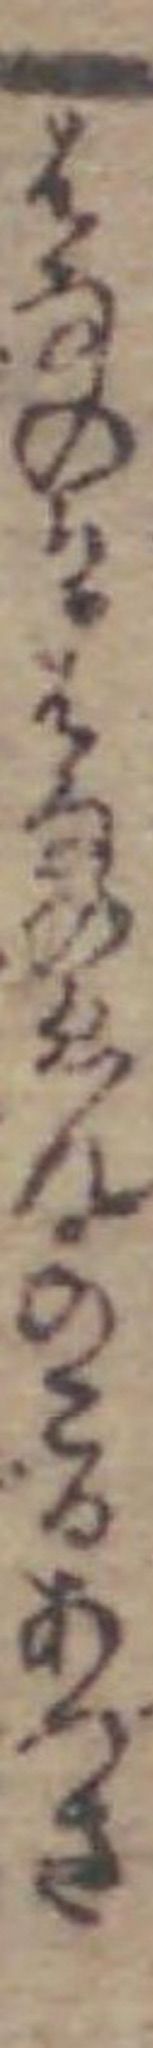はなのか、はるのゑん、のこるあつさ
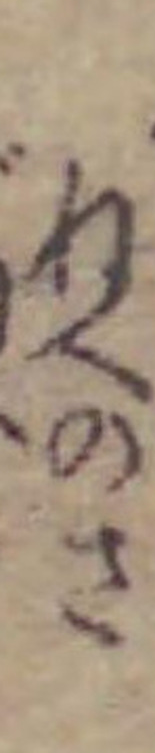ねへのさ
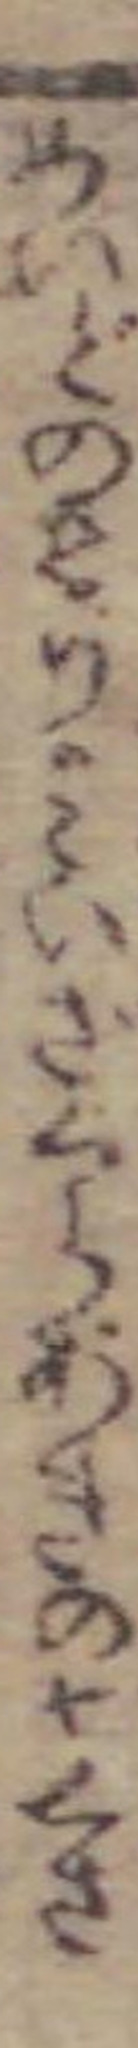めいどのとり、こいざくら、あきの七くさ
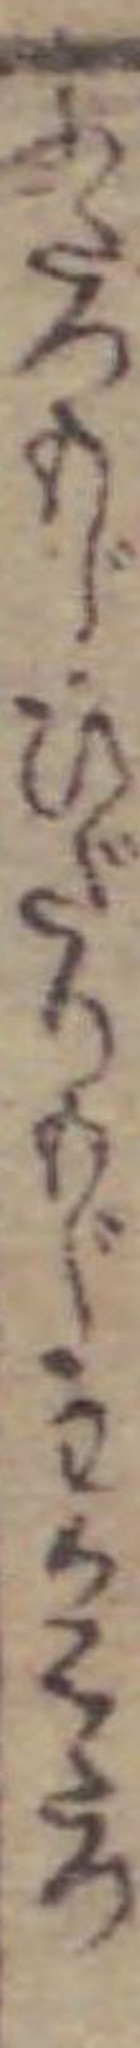ふたつもじ、ひだりもじ、わかこゝろ
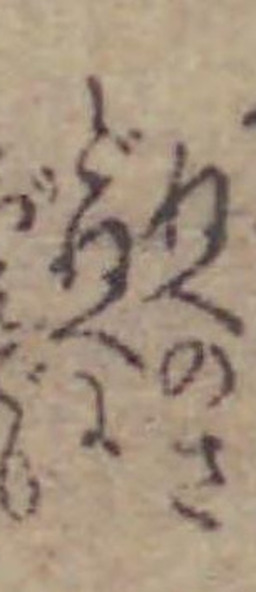どねへに
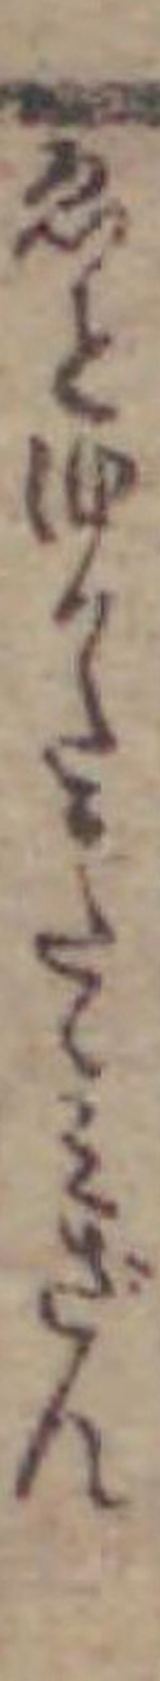ゑとゆかた、たゝみざん
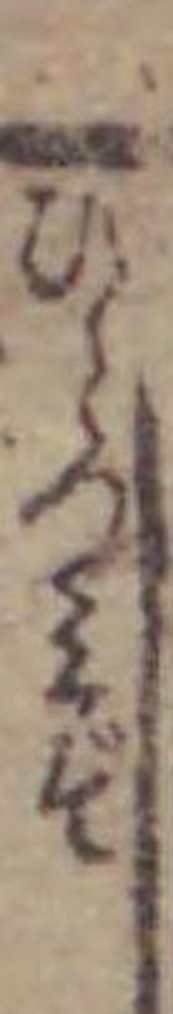ひとつみぞ
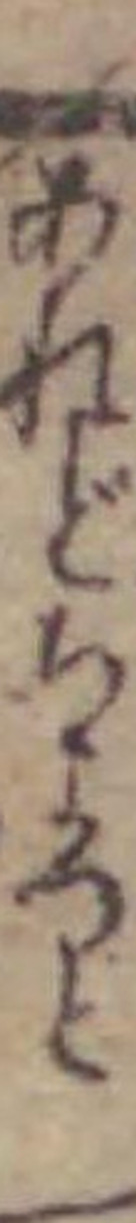あれどちよつと
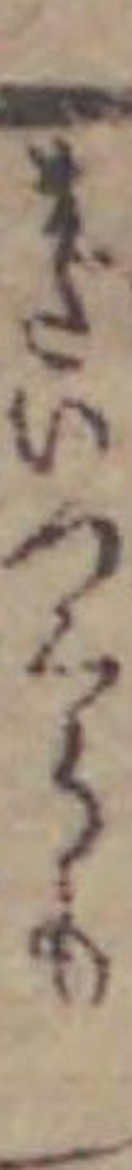まだいつくらも
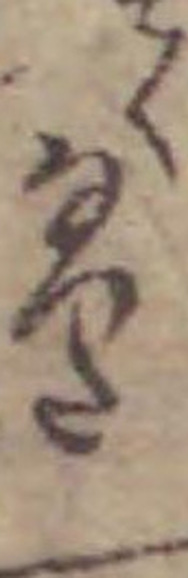なつた
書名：江戸生艶気樺焼 : 3巻
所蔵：国立国会図書館 National Diet Library, JAPAN
